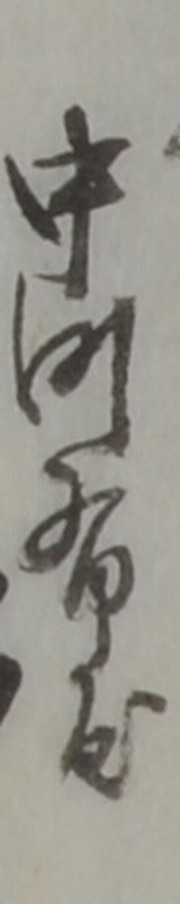中町布屋
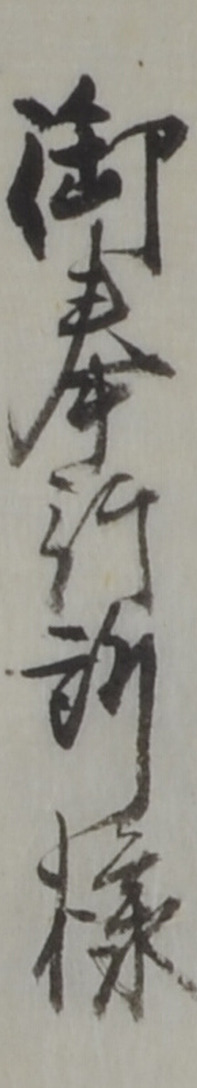御奉行所様
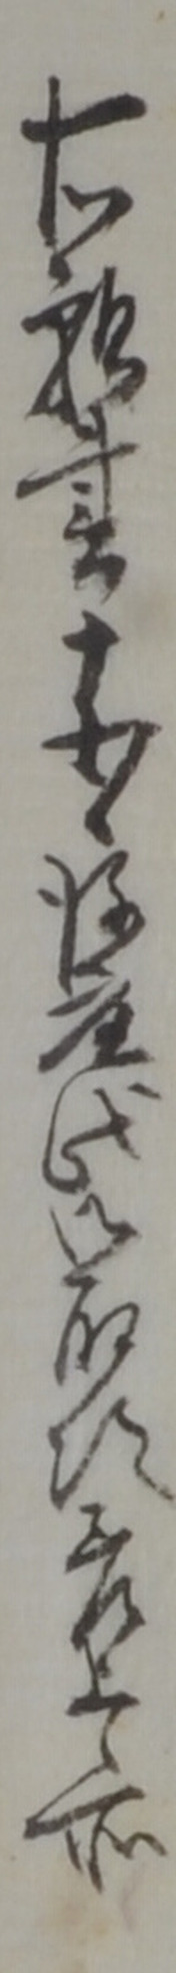右願書十五日後藤氏御取次差上候所
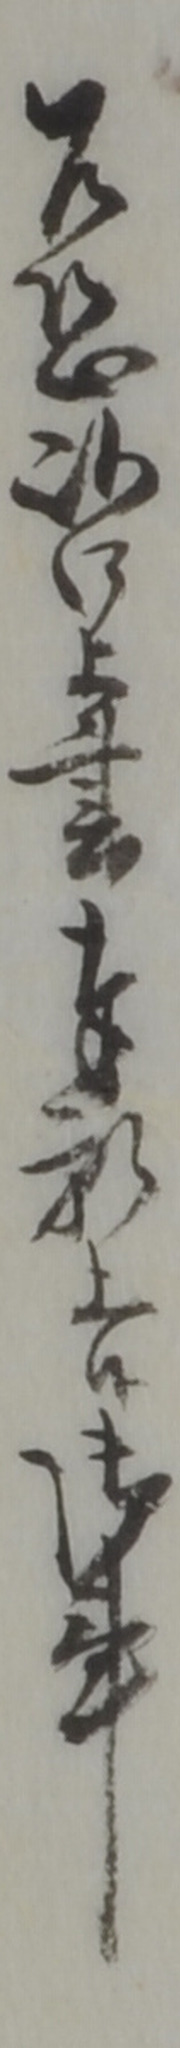乍恐以口上書奉願上候御事
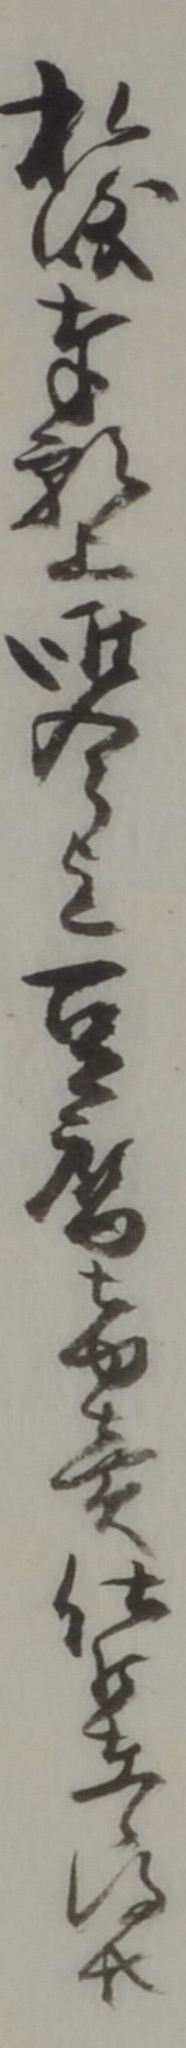私儀奉願上唯今迄豆腐商売仕罷在候得共
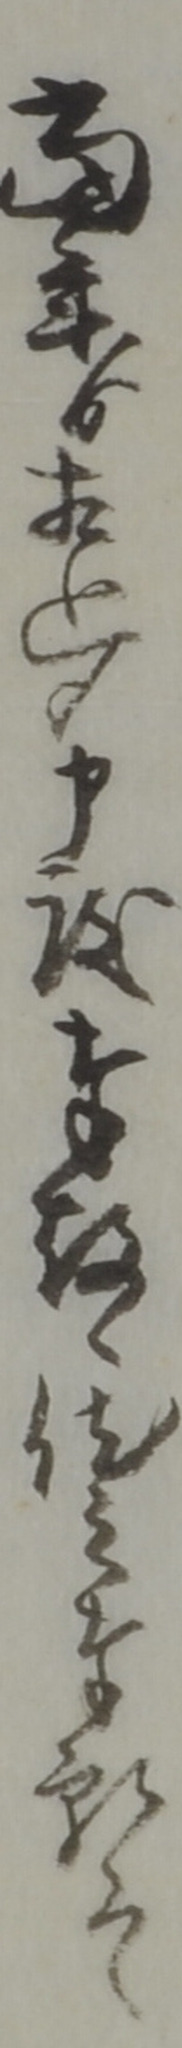当年ゟ相止メ申度奉存候依之奉願上候
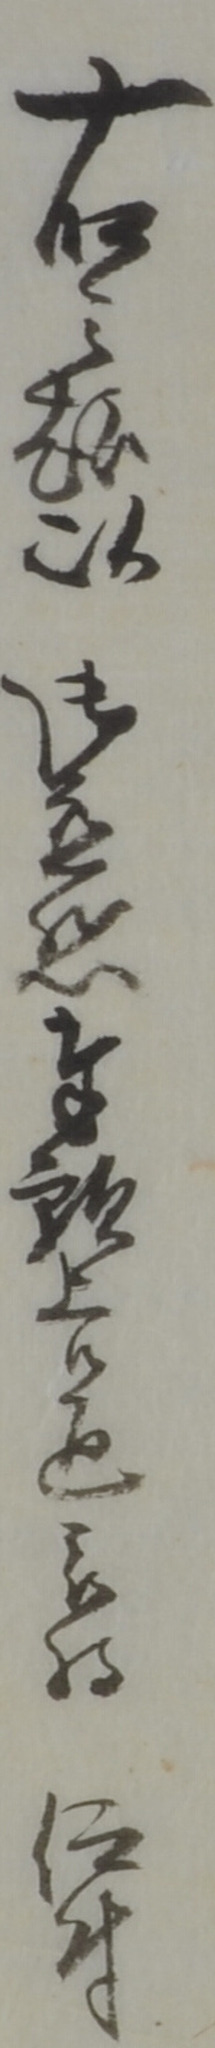右之趣以御慈悲奉願上候通被為仰付
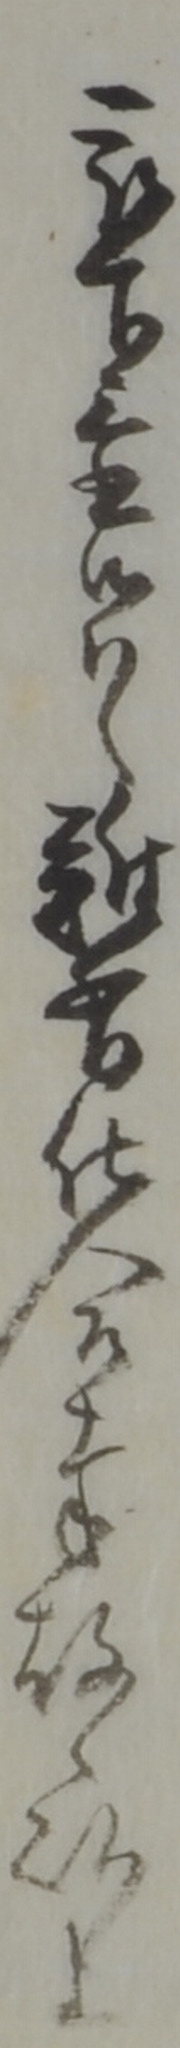被下置候ハヽ難有仕合奉存候以上
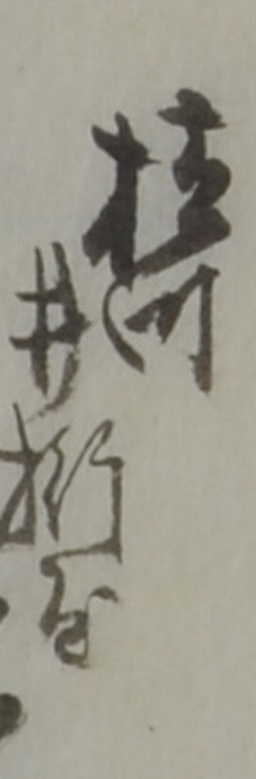井桁屋
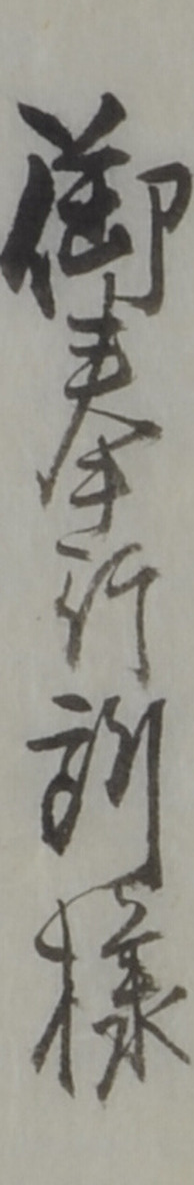御奉行所様
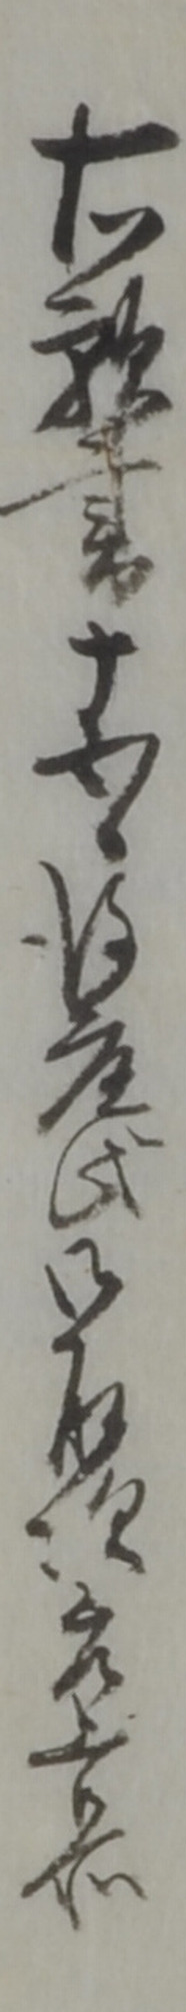右願書十五日後藤氏御取次差上候所

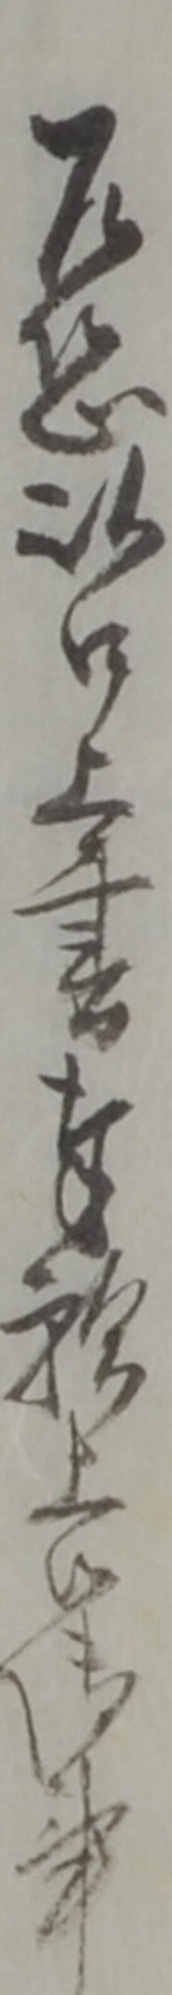乍恐以口上書奉願上候御事
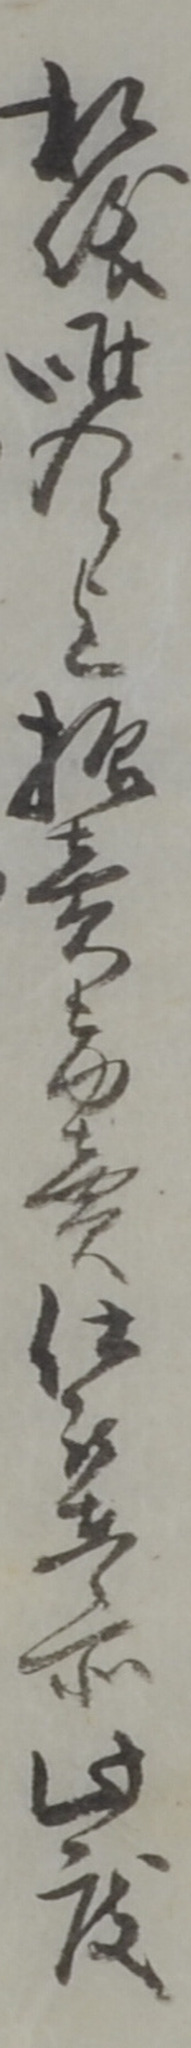私儀唯今迄振売商売仕罷在候所此度
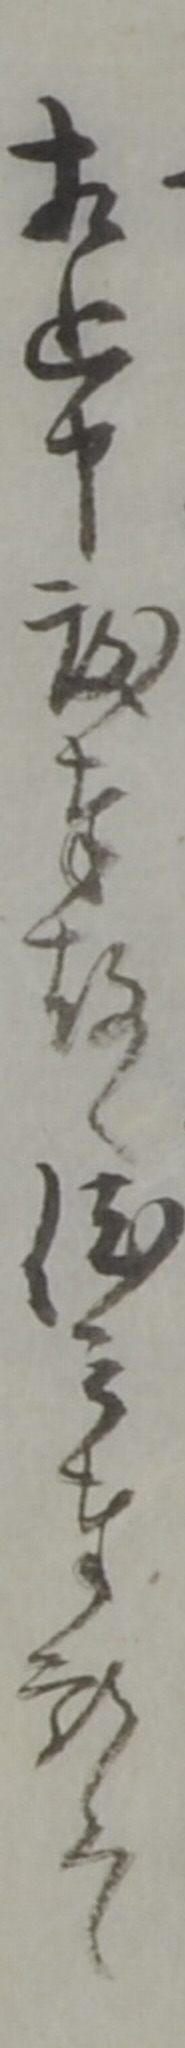相止申度奉存候依之奉願上候
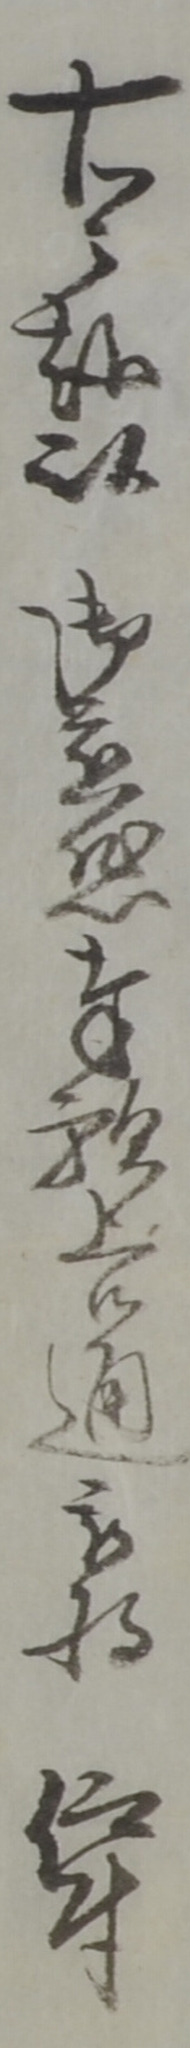右之趣以御慈悲奉願上候通被為仰付
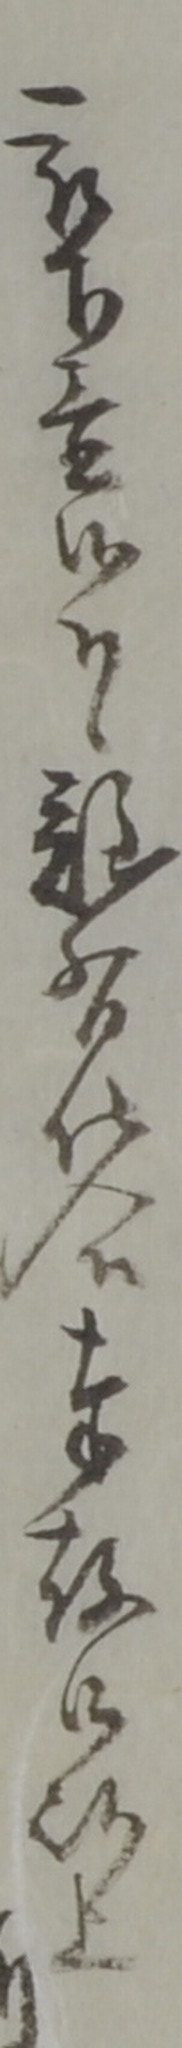被下置候ハヽ難有仕合奉存候以上
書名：諸願書控簿
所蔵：伊那市立高遠町図書館・合同会社AMANE
